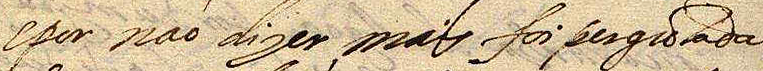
E por não dizer mais foi pergūtada
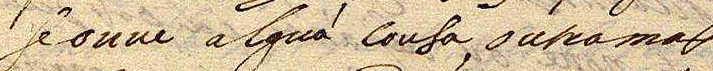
Se ouue alguā cousa outra mais
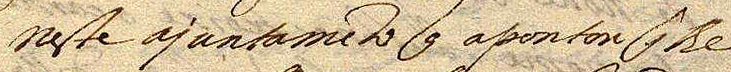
neste ajuntamēto q̄ apontou q̄ lhe
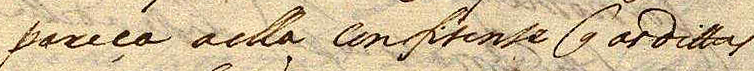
pareça a ella confitente q̄ as dittas
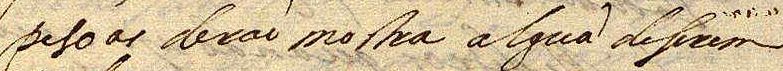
pesoas deraõ mostra alguā de serem
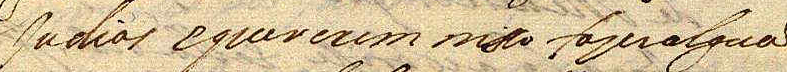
Judias E quererem nisto fazer alguā
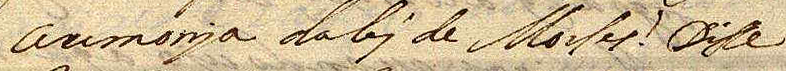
ceremonja da lej de Moises? Disse
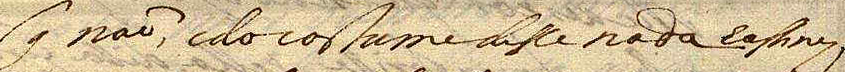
q̄ naõ, e do costume disse nada E assinej
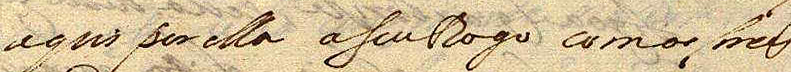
aqui por ella a seu Rogo com os Snrēs
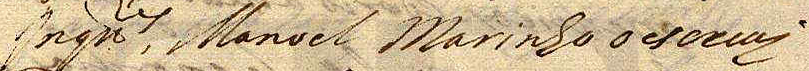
Jnqūres, Manoel Marinho o escreuj
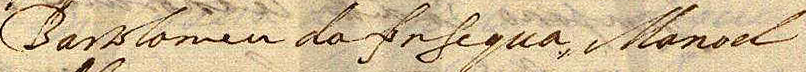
Bartolameu da fonsequa, Manoel
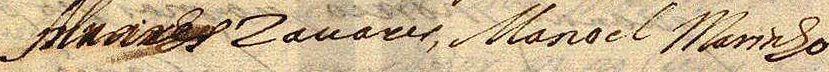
Aluares Tauares, Manoel Marinho
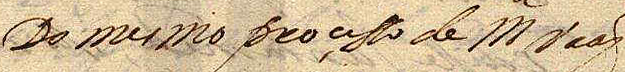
Do mesmo proçesso de Ma Vaaz̄
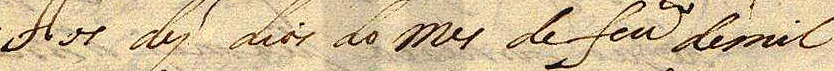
Aos dez̄ dia do mes de feuro de mil
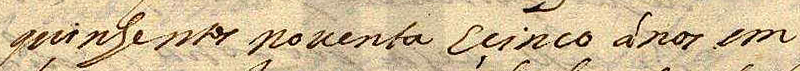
quinhentos nouenta E çinco ānos em
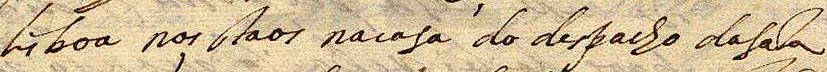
Lisboa nos staos na casa do despacho da sāta
